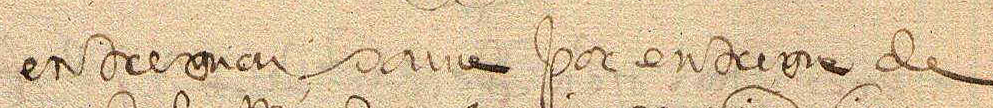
entreguou e ouue por entregue de
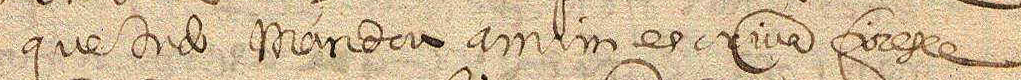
que tudo mandou a mim escriuā fizesse
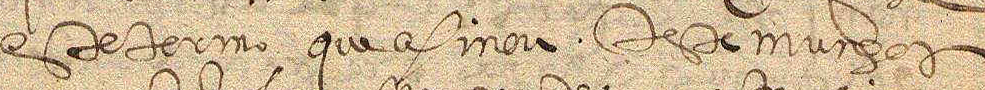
este termo que asinou. testemunhas
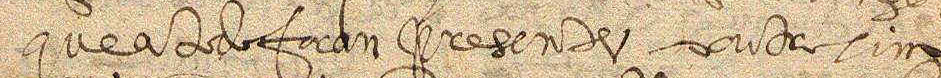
que a todo foram presentes outrosim
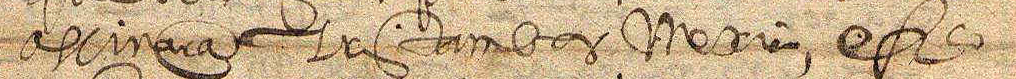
assinarā Tristam vas Mexia, e frco
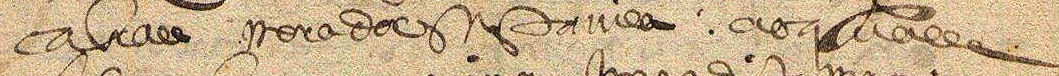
cabrall moradores nesta uilla. ao qualle
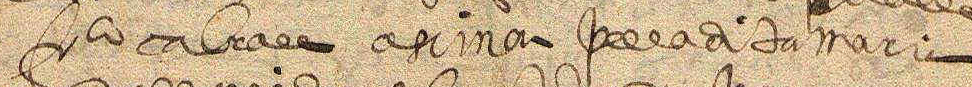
frco cabrall assinou pela dita maria
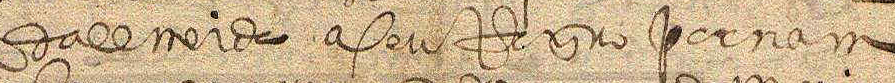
dallmeida a seu Roguo por nam
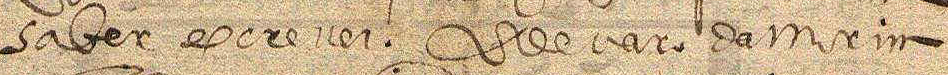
saber escreuer. Alluaro damorim
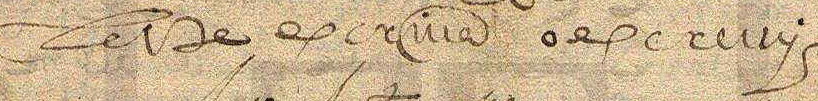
Leite escriuā o escreuy
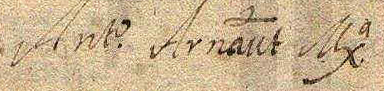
Ant.o Arnaut Mxa
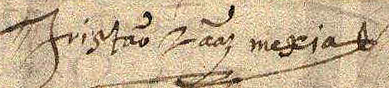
Tristaõ Vāaz mexia
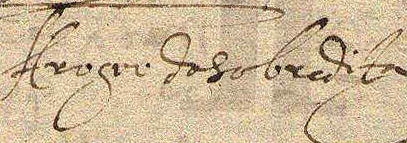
A roguo da sobredita
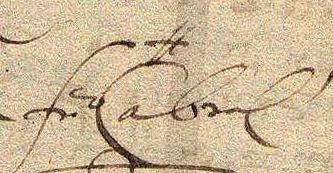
frco Cabral
